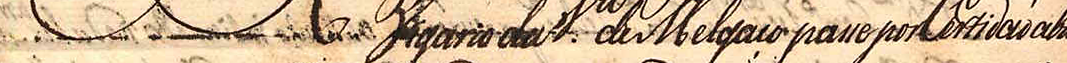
O R.do Vigario da V.a de Melgaço passe por Certidaõ abai
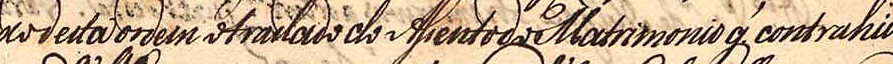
xo desta ordem o traslado do Assento de Matrimonio q̄ contrahio
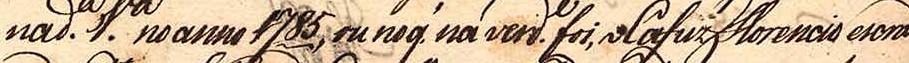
na d.a V.a no anno 1785, ou no q̄ na verdade foi, Cafuz Florencio escra
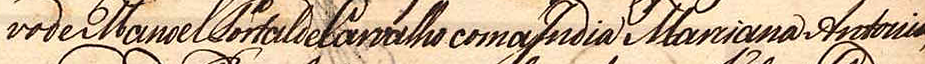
vo de Manoel Portal de Carvalho com a Jndia Mariana Antonia,
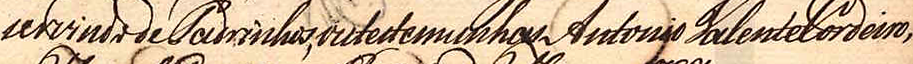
servindo de Padrinhos, ou testemunhas Antonio Valente Cordeiro,
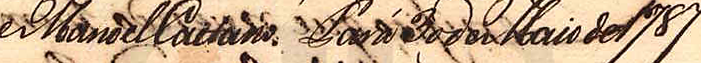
e Manoel Caetano. Pará 30 de Maio de 1787
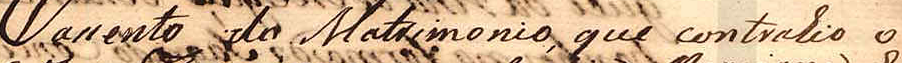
O assento do Matrimonio, que contrahio o
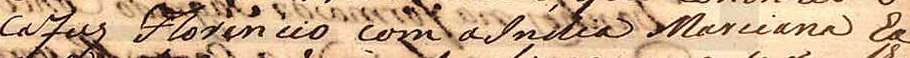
cafus Florencio com a Jndia Mariana ha
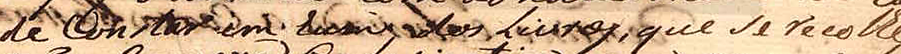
de Constar em hum dos Livros, que se recolhe
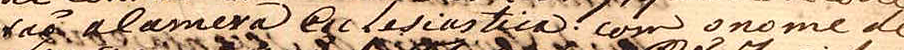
raõ a camera Ecclesiastica com o nome de
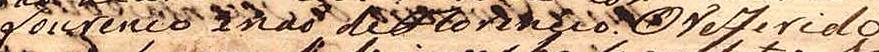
Lourenço indo de Florencio. O referido
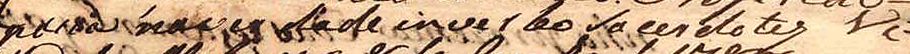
pesoa na verdade de inverbo Sacerdotes Vi
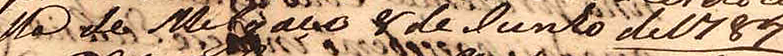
lla de Melgaço 8 de Iunho de 1787
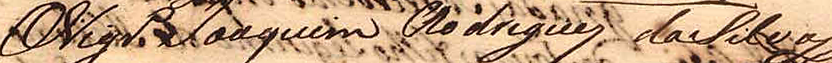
O Vig.ro Ioaquim Rodrigues da Silva
